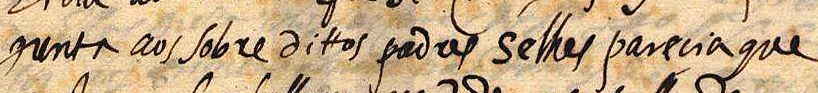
gunta aos sobredittos padres se lhes parecia que
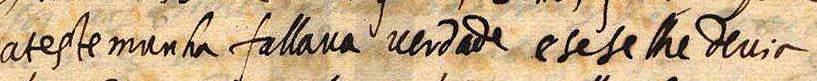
a testemunha fallaua uerdade e se se lhe deuia
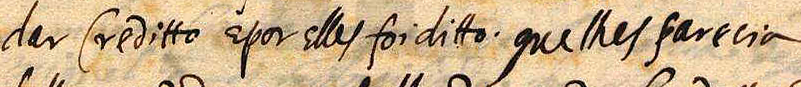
dar Creditto E por Elles foi ditto. que lhes parecia
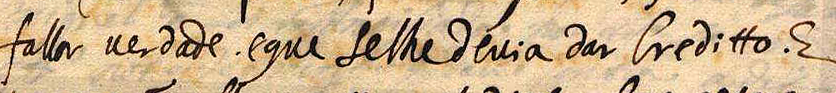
fallar uerdade. e que se lhe deuia dar Creditto. E
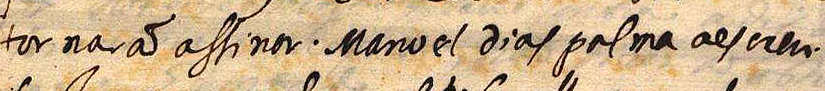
tornarā assinar. Manoel dias palma o escreui
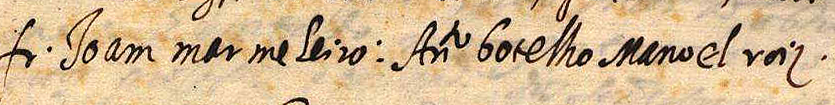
fr. Ioam marmeleiro: Anto boelho Manoel roiz.
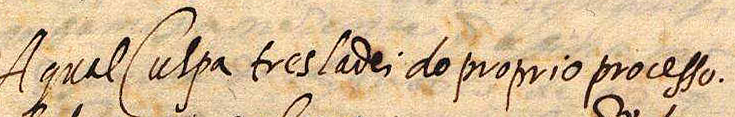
A qual Culpa tresladei do proprio processo.
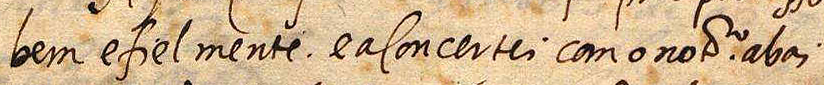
bem e fielmente. e a Concertei com o not.ro abai
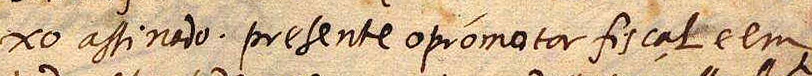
xo assinado. presente o promotor fiscal e em
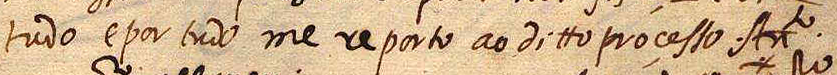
tudo e por tudo me reporto ao ditto processo. Anto.
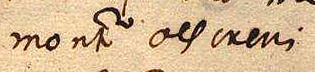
montro o escreui
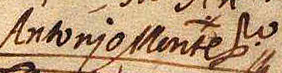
Antonjo Montero.
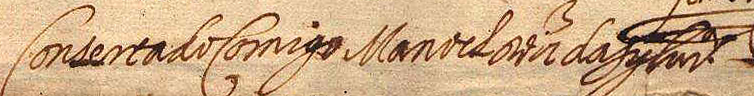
Consertado Comigo Manoel Roiz̄ da sylur.a
